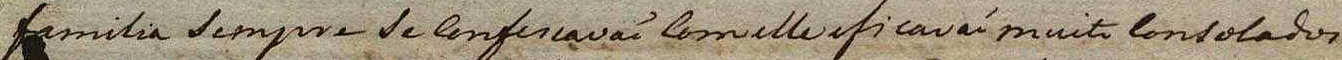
familia sempre se confessavaõ Com elle e ficavaõ muito consoLados
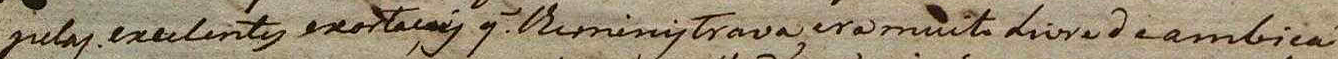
pelas excelentes exortaçoẽs q̄ lhe ministrava, era muito Livre da ambiçaõ
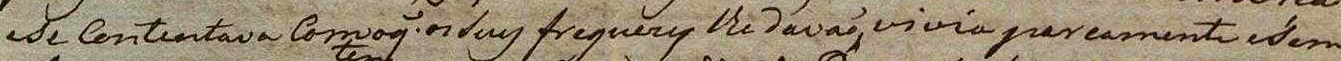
e se contentava com o q̄ os seus freguezes lhe davaõ, vivia parcamente e sem
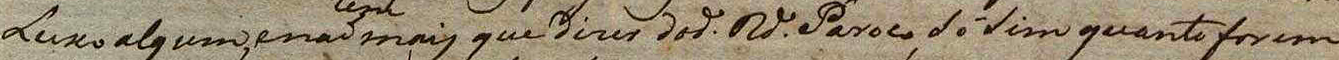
Luxo algum, e naõ tem mais quer dizer do d.o Rd.o Paroco, só sim quanto forem
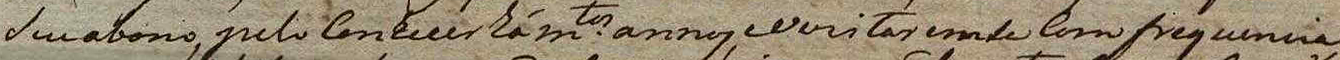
seu abono, pelo Conhecer há m.tos annos, e vezitaremse com frequencia,
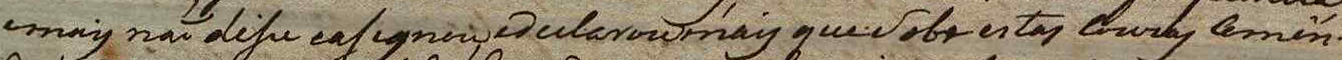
e mais naõ disse e asignou, e declarou mais que sabe estas couzas com in
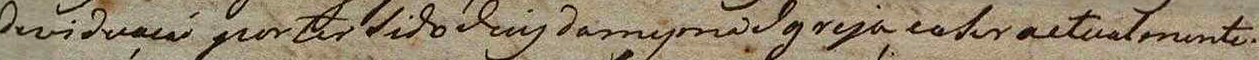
deviduaçaõ por ter sido Iuis da mesma Igreja, e o Ser actualmente.
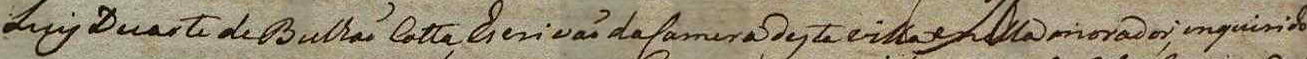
Luis Duarte de Bulhaõ Cotta, Escrivaõ da Camera desta villa e nella morador, inquirido
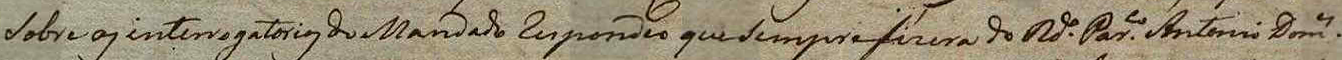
sobre os interrogatorios do Mandado Respondeo que sempre fizera do Rd.o Par.co Antonio Dom.es
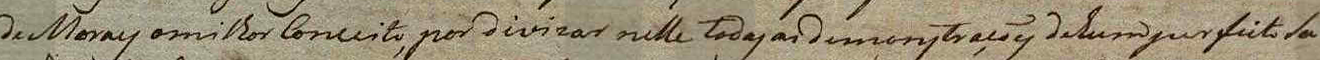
de Morais o milhor Conceito, por divizar nelle todas as demonstrações de hum perfeito sa
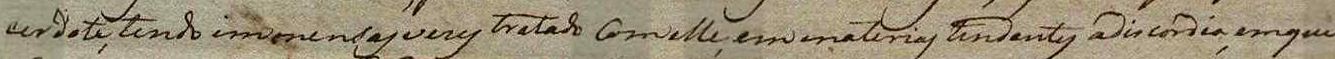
cerdote, tendo immensas vezes tratado Com elle, em materias tendentes a discordia, em que
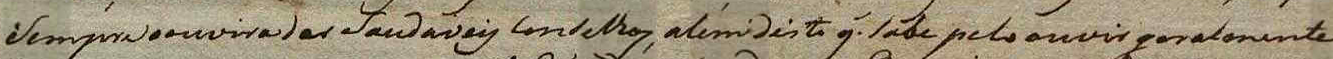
sempre o ouvira dar saudaveis conselhos, alem disto q̄ sabe pelo ouvir geralmente
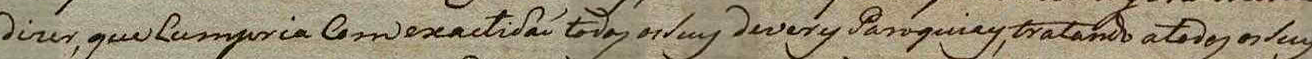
dizer, que Cumpria Com exactidaõ todos os seus deveres Paroquiaes, tratando a todos os seus
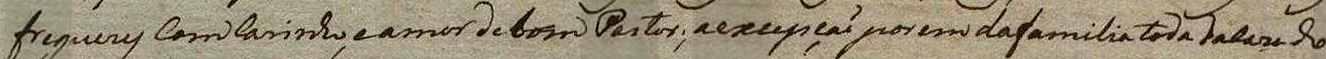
freguezes Com Carinho, e amor de bom Pastor, a excepçaõ porem da familia toda do cazado
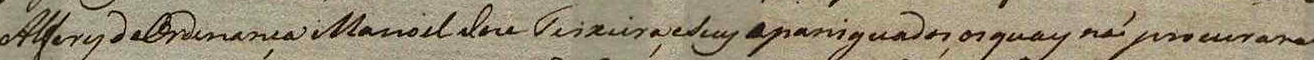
Alferes de Ordenança Manoel Ioze Teixeira, e seus apaniguados, os quaes naõ procuraraõ
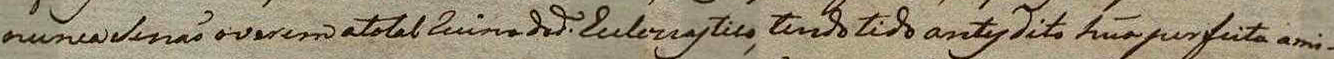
nunca senaõ o verem a total Ruina do d.o Eccleziastico, tendo tido antes dito hūa perfeita ami
